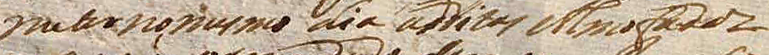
meter no mesmo dia as ditas Almofadaz
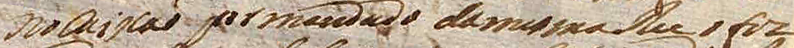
no caixaõ por mandado da mesma Ree o fez
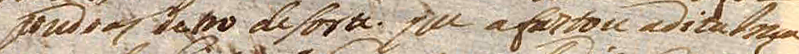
pondoas detro de sorte que afastou a dita Ima
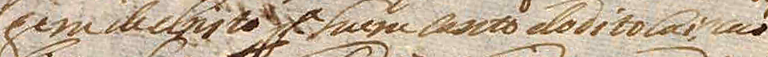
gem de christo pa hum canto do dito caixaõ
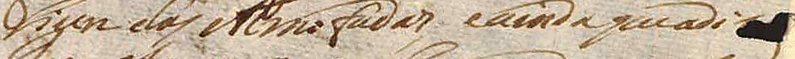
liure das Almofadas, e ainda que a di_
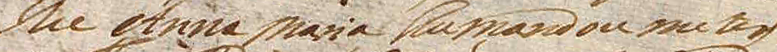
Ree Anna maria lhe mandou meter
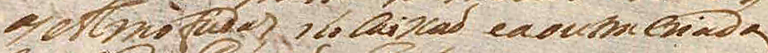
as Almofadas no caixaõ e a outra criada
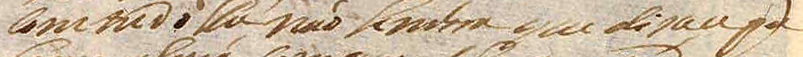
com tudo lhe naõ lembra que discece pa
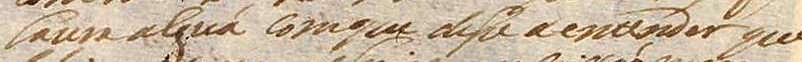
laura alguā com que disse a entender que
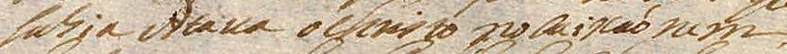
sabia estaua o christo no caixaõ nem
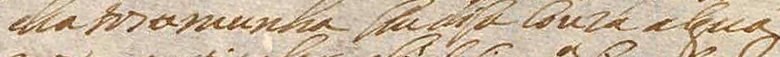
ella testemunha lhe disse couza algua
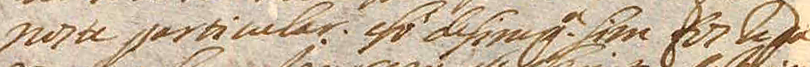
neste particular. e só de sim p.a sim fez Repa
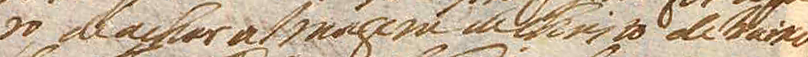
ro de achar a Imagem de christo debaixo
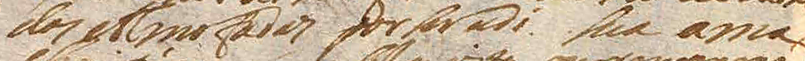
das Almofadas por ser a di. sua ama
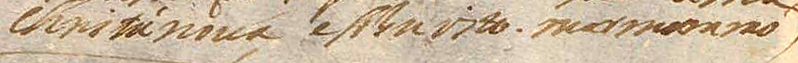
christã noua e sobre isto murmuraraõ
